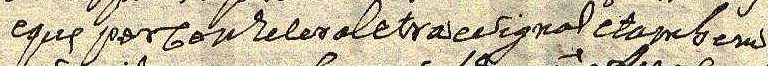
e que por conhecer a letra e signal e tambem
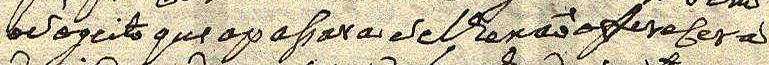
o sogeito que a passara se lhe naõ offereCera
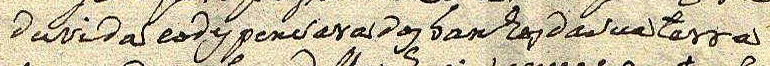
duvida e o despensara dos banhos da sua terra
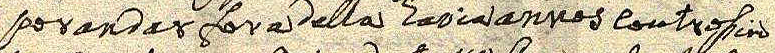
por andar fora della Havia annos e outrossim
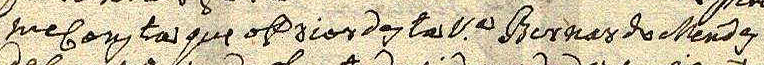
me Consta que o Prior desta V.a Bernardo Mendes
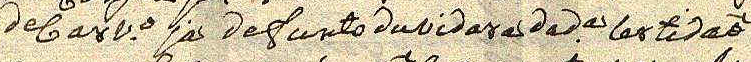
de Carv.o ja defunto duvidara da d.a certidaõ
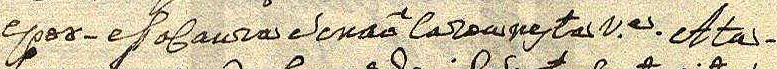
e por - essa Cauza senaõ cazou nesta V.a. Ata
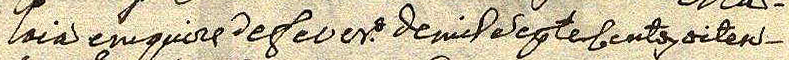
laia em quize de fever.o de mil sesteCentos oiten
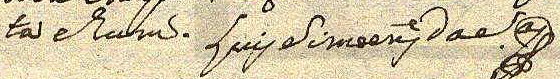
ta e hum. Luis Simoens da S.a
